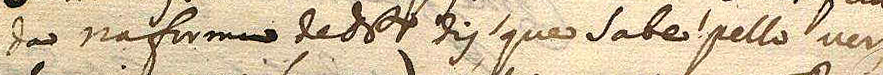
da na forma de drto dis que sabe pello uer
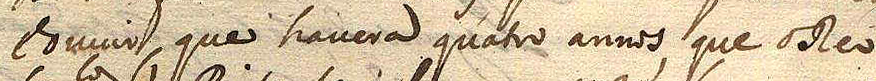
e ouuir que hauera quatro annos, que o Reo
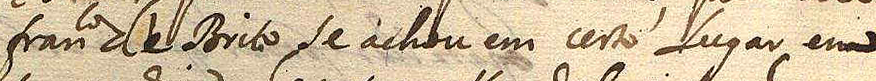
franco de Brito se achou em certo Lugar em
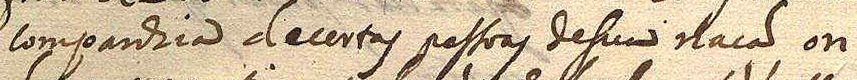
companhia de certas pessoas de sua naçaõ, on
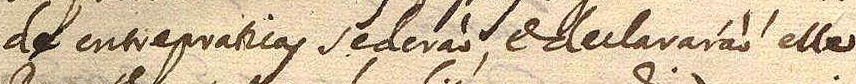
de entre praticas se derão, e declararaõ elle
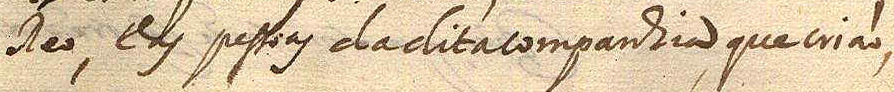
Reo, E as pessoas da dita companhia que criaõ,
